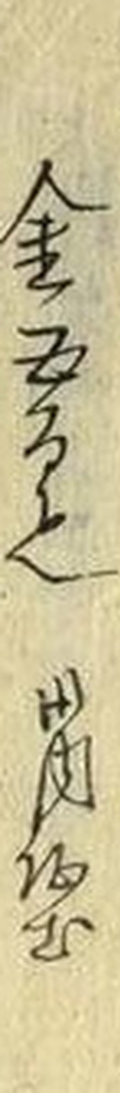金五百疋御内証出
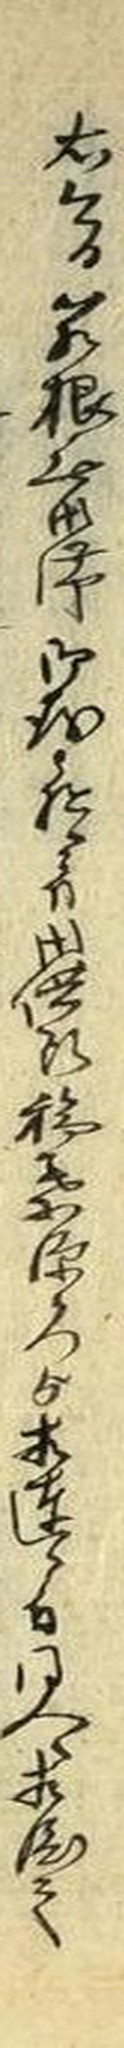右今日箱根無御滞御越被遊候ニ付御供頭稲葉源右衛門ゟ相達候ニ付同人へ相渡之
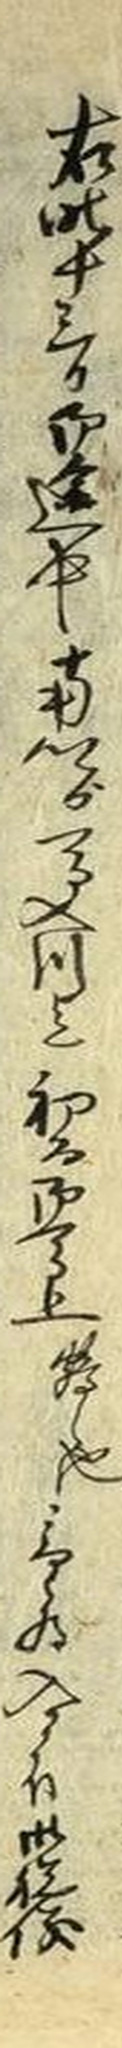右昨十三日御途中南郷ゟ馬入川迄初而御馬上鶴之池ニ而被為入候付御祝儀
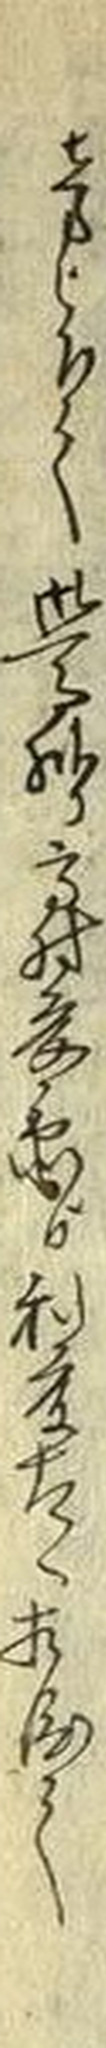旁被下之御馬掛り高村藤兵衛ゟ利藤太へ相渡之
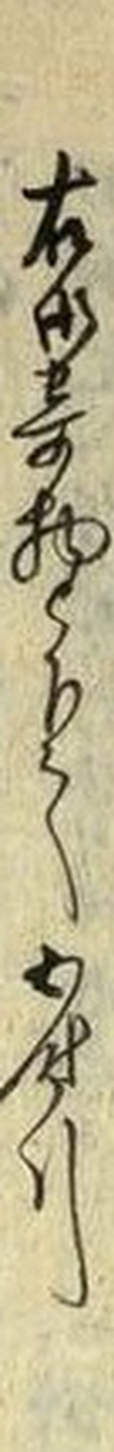右御寄物被下之五時引
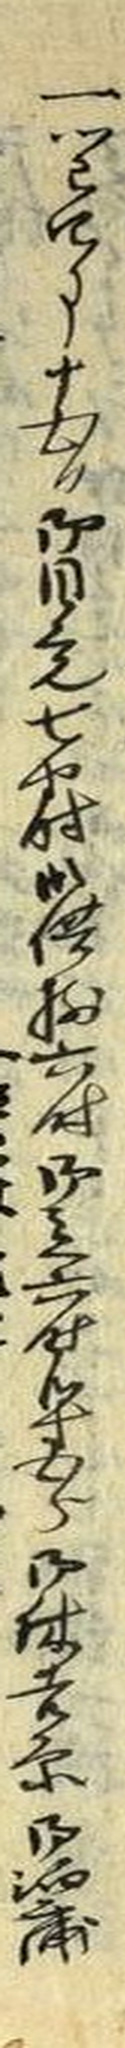一閏四月十五日御目覚七半時御供揃六時御立六時弐寸五分御休吉原御泊蒲
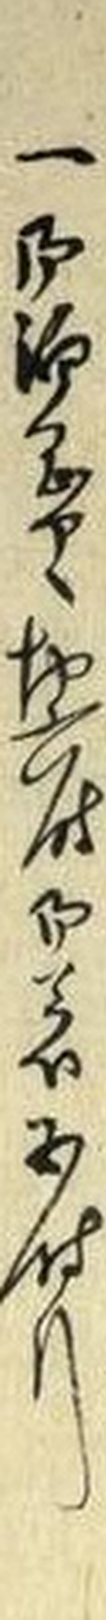一御泊岡部へ切六時御着五時引
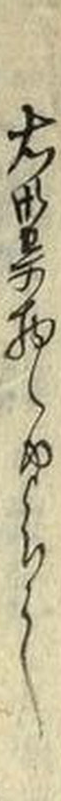右御寄物之内被下之
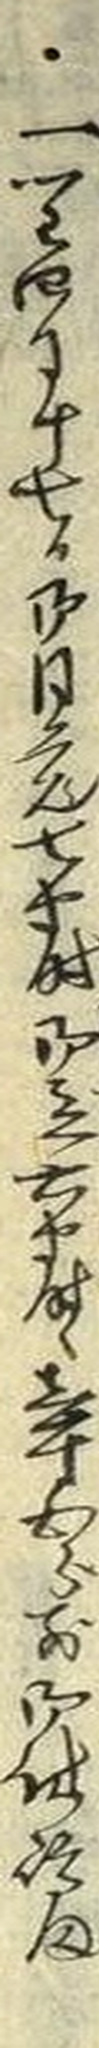一閏四月十七日御目覚七半時御供揃六時御立六半時壱寸五分前御休島田
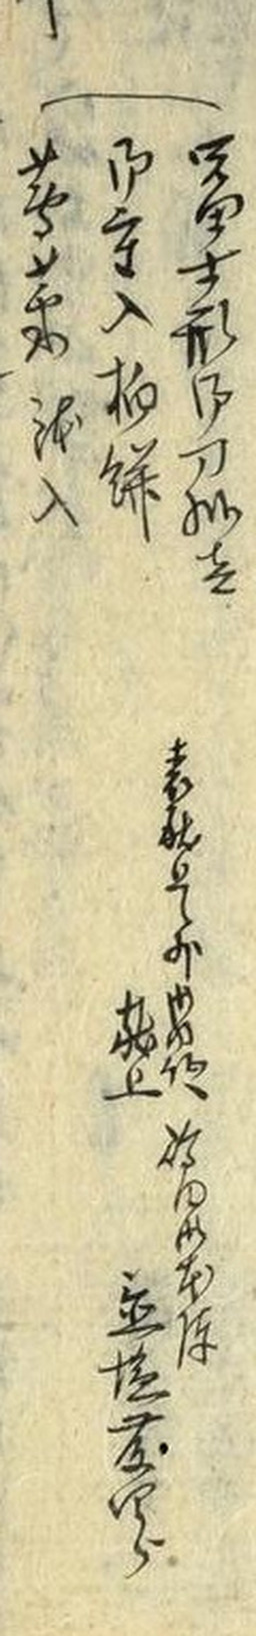御重入柏餅献上置塩藤四郎
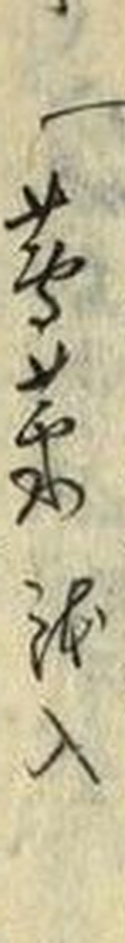蓴菜鉢入
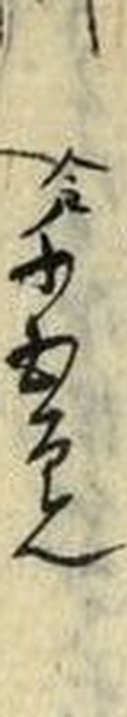金千五百疋

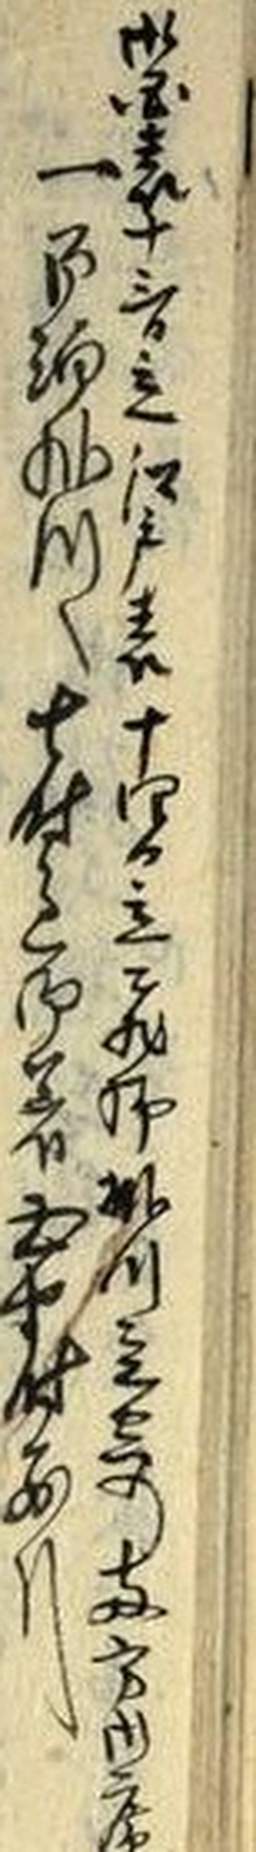一御泊掛川へ七時過御着五半時前引
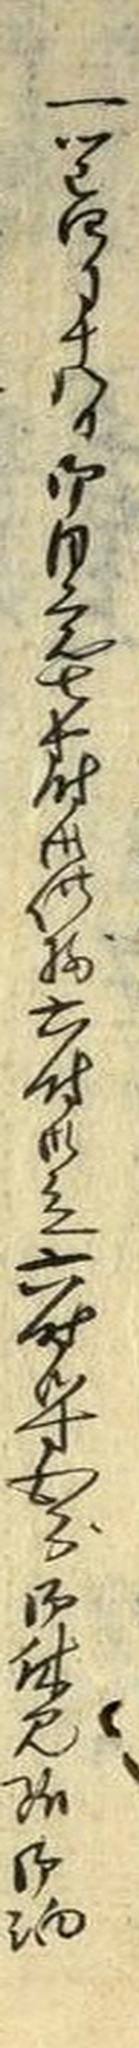一閏四月十八日御目覚七半時御供揃六時御立六時弐寸五分御休見附御泊
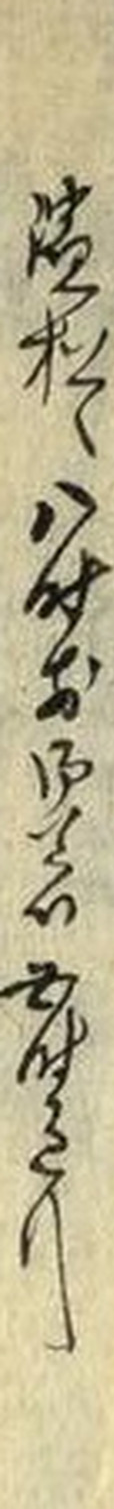浜松へ八時前御着五時過引
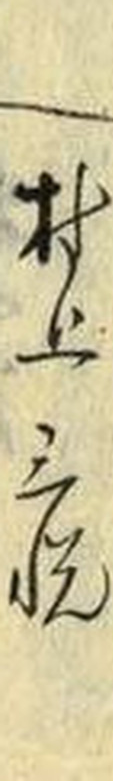村上三悦
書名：少傅日録抄（斉善付側向頭取日記、江戸并道中、初入在国、逝去後…
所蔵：福井県文書館 Fukui Prefectural Archives
